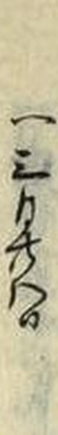一三月廿七日
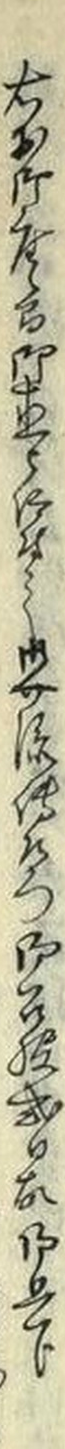右於御座之間御直被仰付之御介添伝左衛門御召服式日故御上下
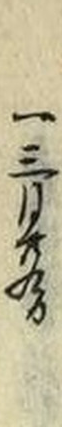一三月廿七日
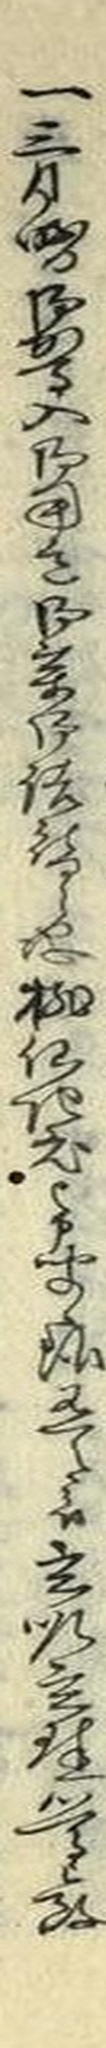一三月晦日御駕入御用意御薬御詰替之儀桃仙院老被申聞候趣有之ニ付玄順玄珪篤被致
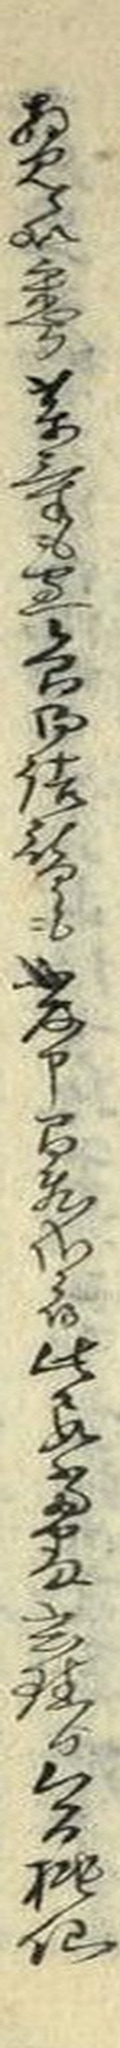拝見候処悉ク薬気も宜候間御詰替ニも及申間敷哉ニ付此段当番玄珪ゟ今日桃仙
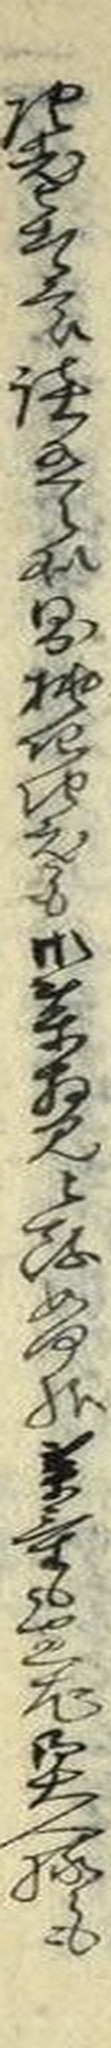院老被出候節談有之候処則桃仙院老も御薬拝見被致如何様薬気も宜尤御大人様ニも
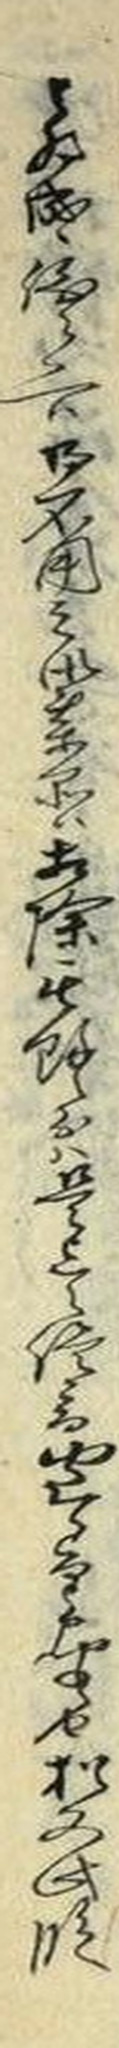被為成候儀ニ候ヘハ御不用之御薬品ハ相除其余之分ハ是迄之儘ニ而宜候旨被申聞候由猶又此段

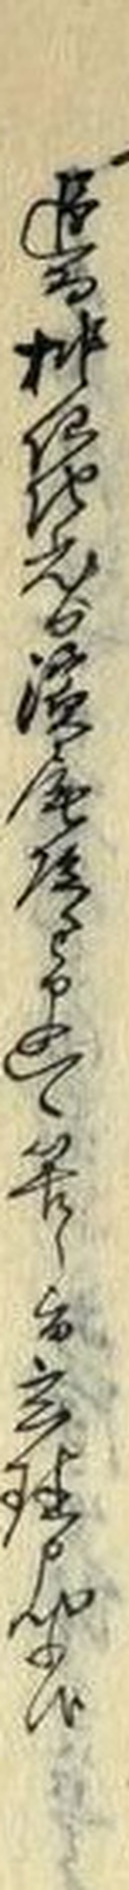追而桃仙院老ゟ浜尾殿へ被申込候筈之旨玄珪申聞候
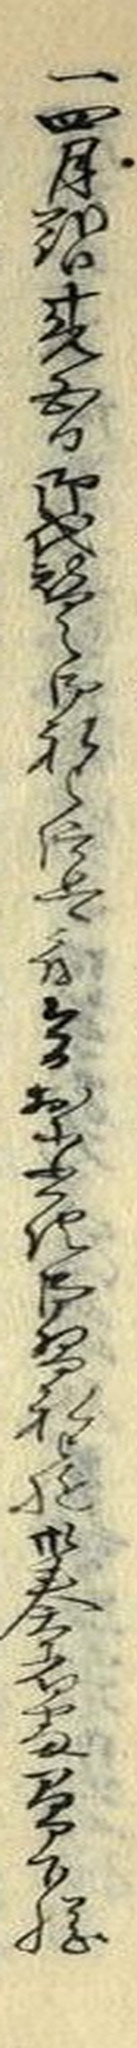一四月朔日来ル五日御代替之御礼被仰上候ニ付今日於小書院御習礼被遊御奏者番間部下総
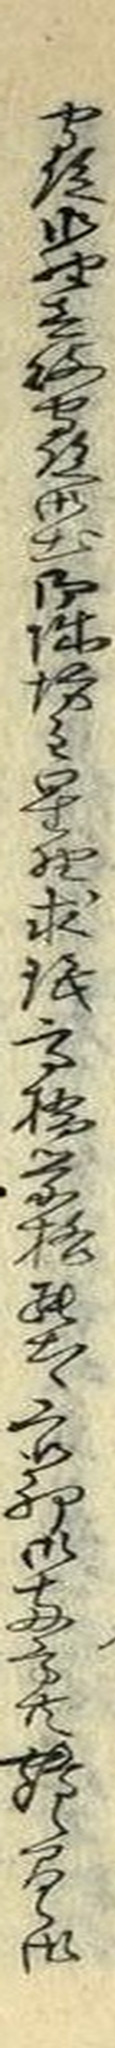守殿水野壱岐守殿御出御城坊主星野求珉高橋栄格罷出候最初御両方共鶴之間へ御
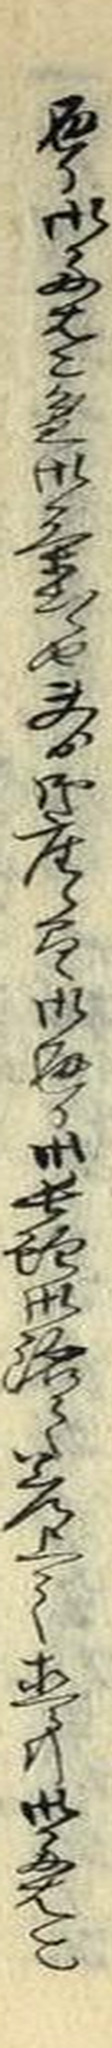通り御たはこ盆御茶出候由夫ゟ御座之間へ御通り御長鮑御銘々へ差上之直ニ引御たはこ
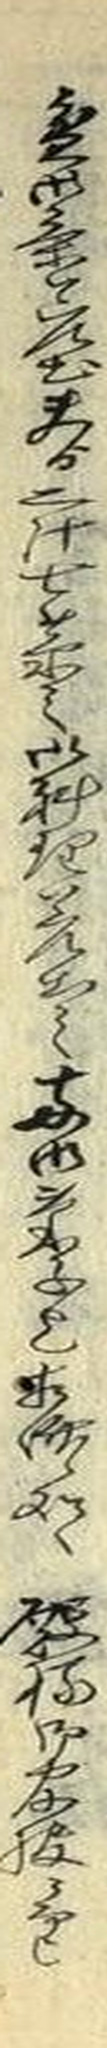盆御茶差出夫ゟ二汁七菜之御料理差出之両御菓子迄相済候処へ殿様御官服ニ而被
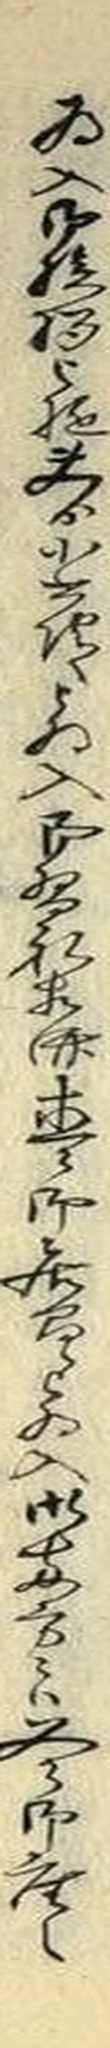為入御挨拶被遊夫ゟ小書院へ被為入御習礼相済直ニ御居間へ被為入御両方ニハ又々御座之
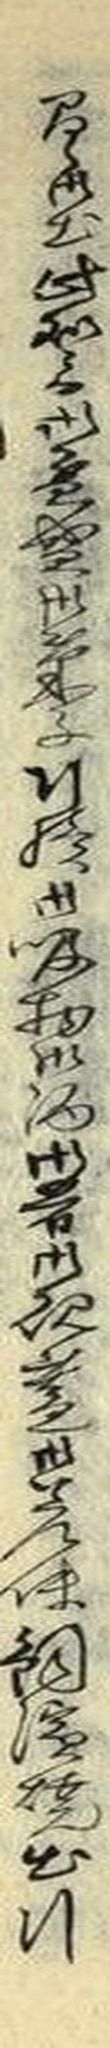間へ御出此処ニ而御盆盛御菓子引続御吸物御酒御肴御硯蓋御差味鯛浜焼出引
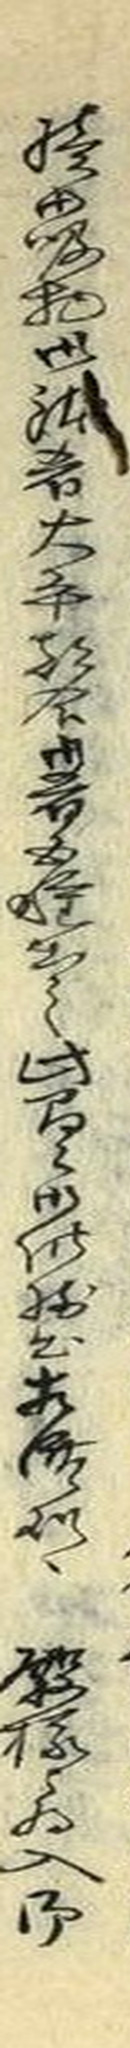続御吸物御鉢肴大平都合御肴五種出之此間ニ御供揃出相済候処へ殿様被為入御
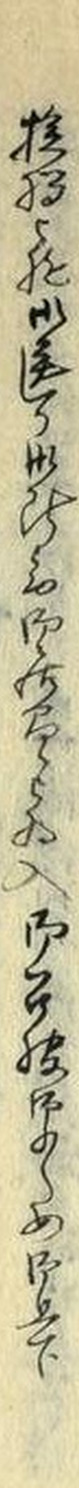挨拶被遊御送り御断ニ而御居間へ被為入御召服御のしめ御上下
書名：少傅日録抄（斉善付側向頭取日記、在府）
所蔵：福井県文書館 Fukui Prefectural Archives
